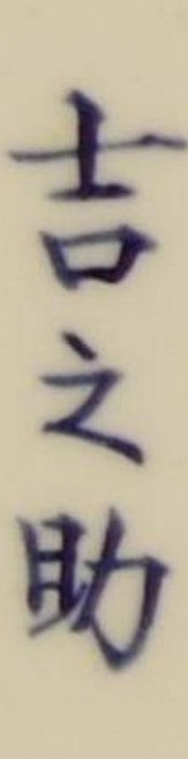吉之助
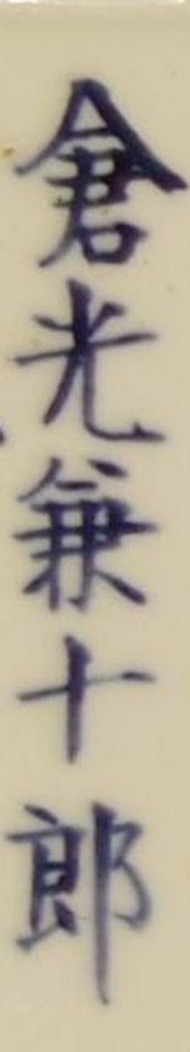倉光兼十郎
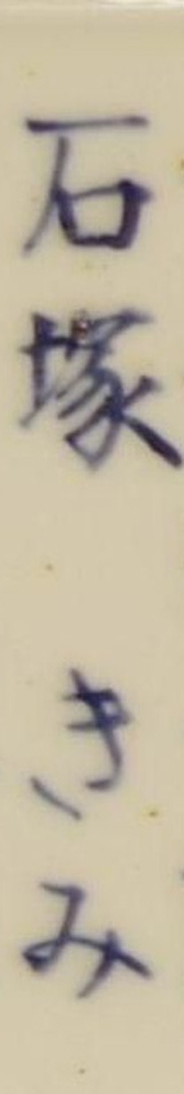石塚きみ
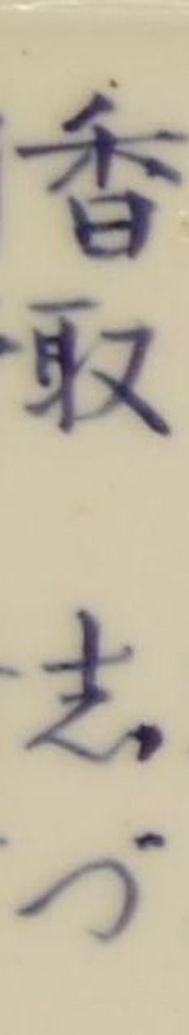香取しづ
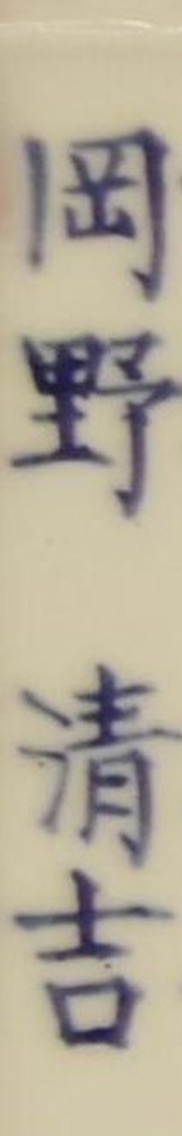岡野清吉

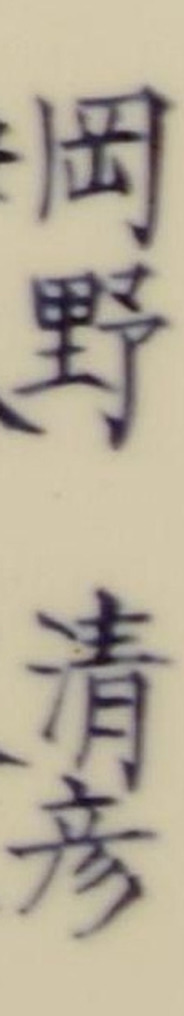岡野清彦
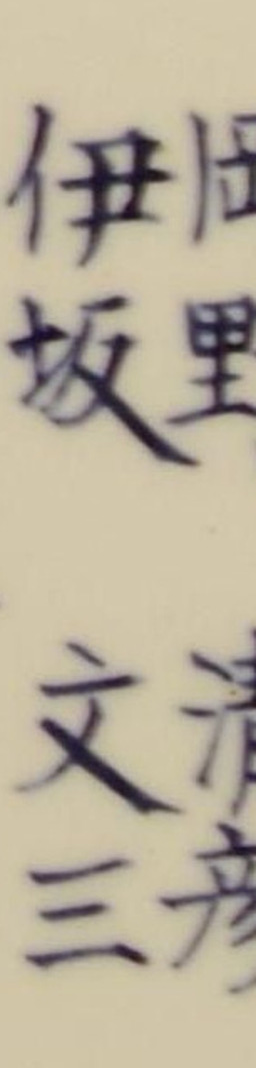伊坂文三
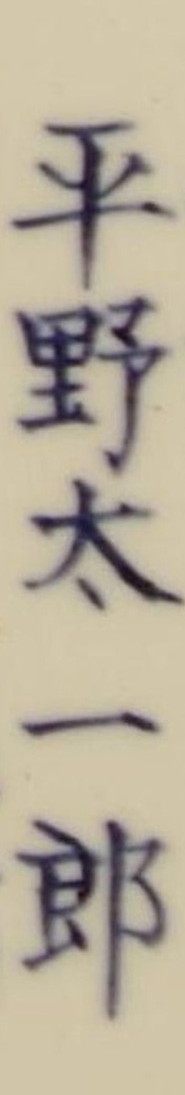平野太一郎
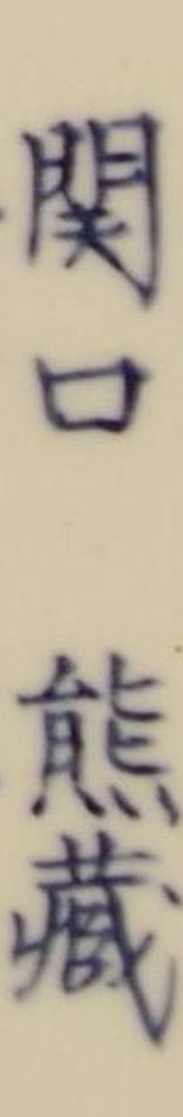関口熊蔵
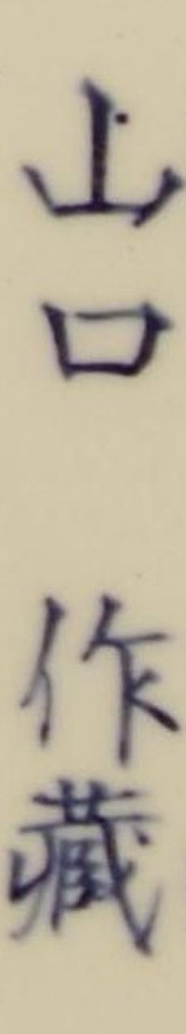山口作蔵
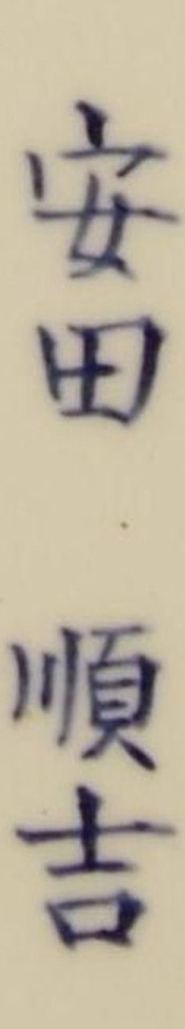安田順吉
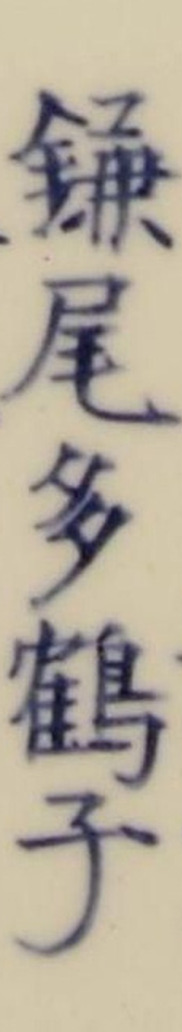鎌尾多鶴子
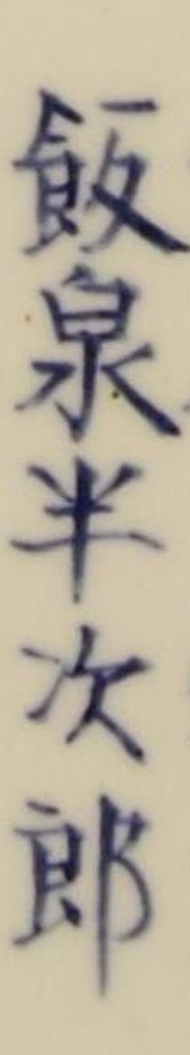飯泉半次郎
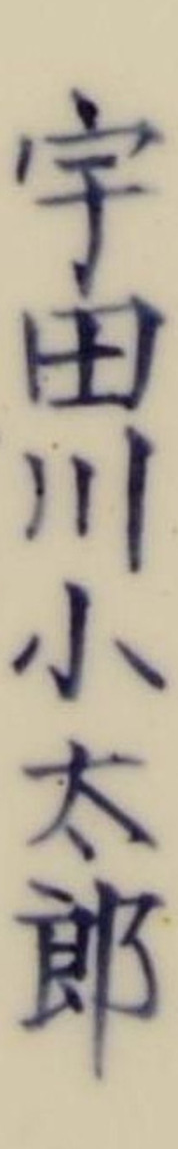宇田川小太郎
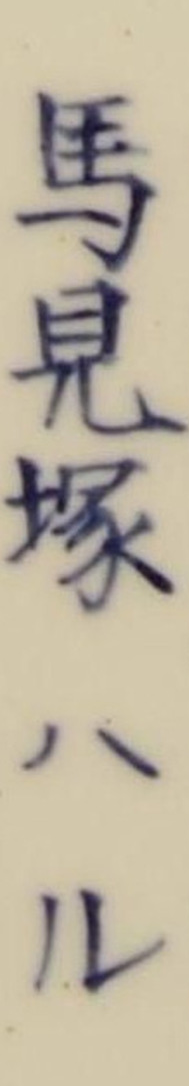馬見塚ハル
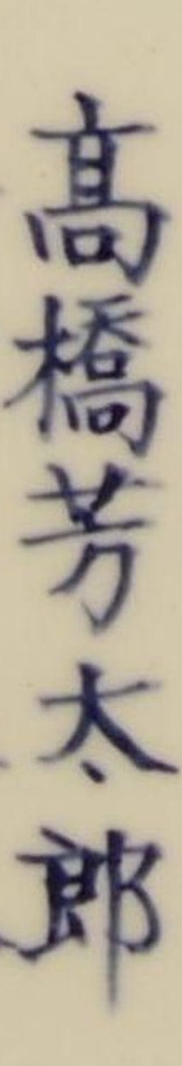高橋芳太郎
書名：E~L
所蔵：高野山金剛峯寺
